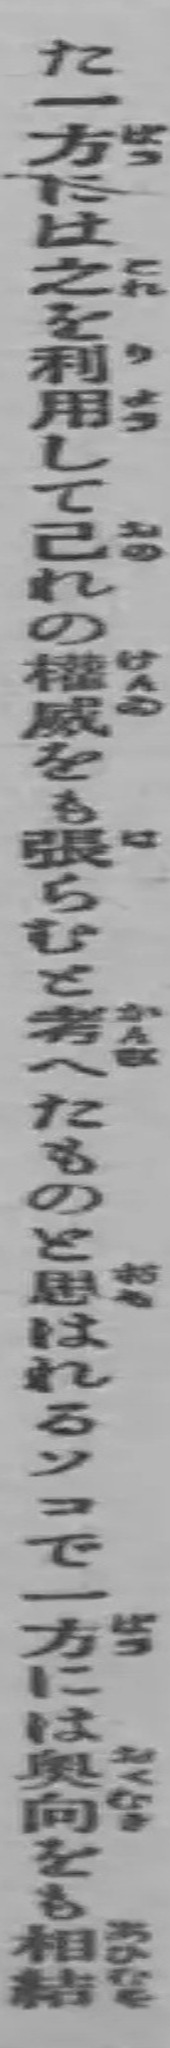た一方には之を利用して己れの権威をも張らむと考へたものと思はれるソコで一方には奥向をも相結
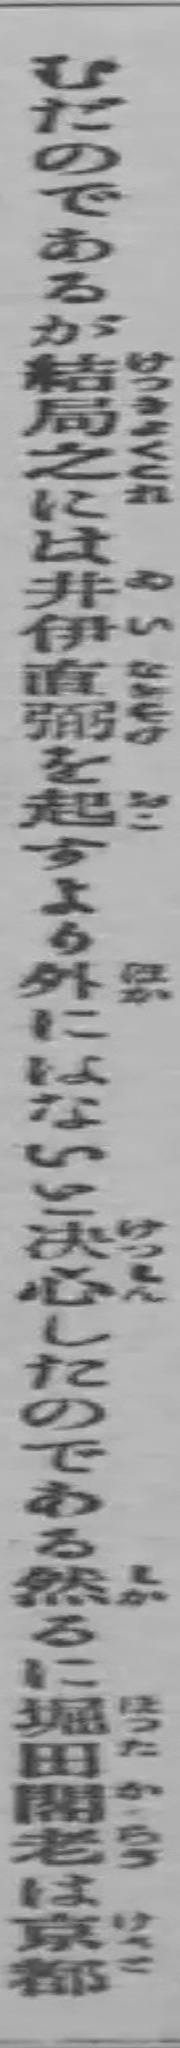むだのであるが結局之には井伊直弼を起すより外にはないと決心したのである然るに堀田閣老は京都
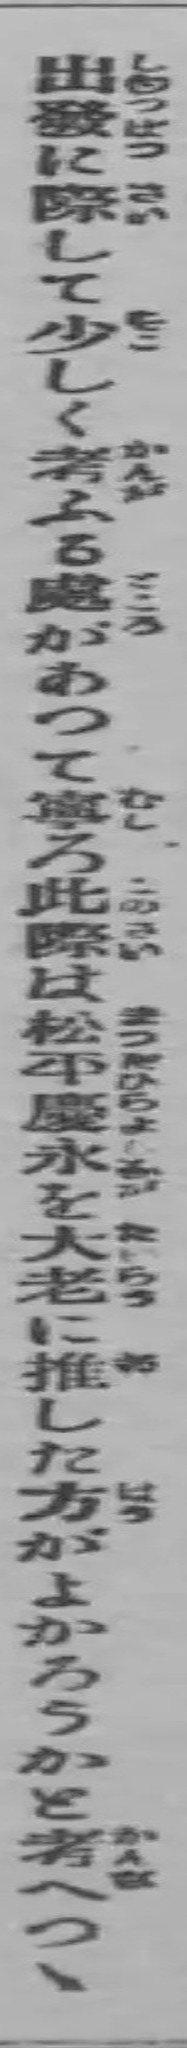出発に際して少しく考ふる処があつて寧ろ此際は松平慶永を大老に推した方がよかろうかと考へつゝ
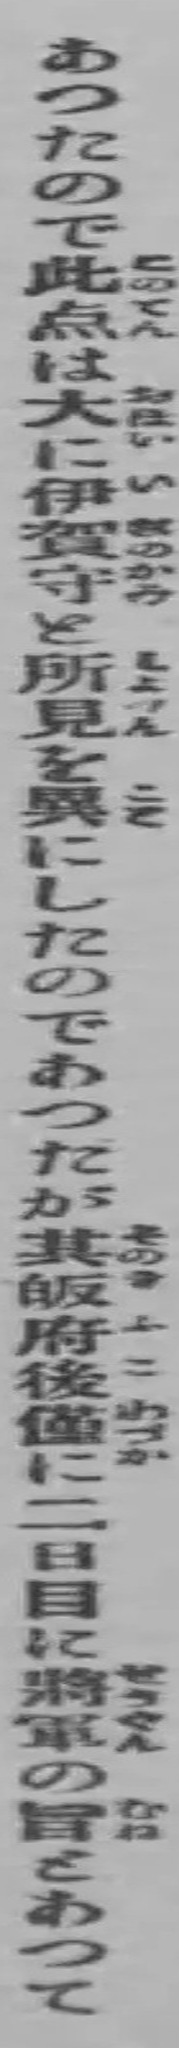あつたので此点は大に伊賀守と所見を異にしたのであつたが其皈府後僅に二日目に将軍の旨とあつて
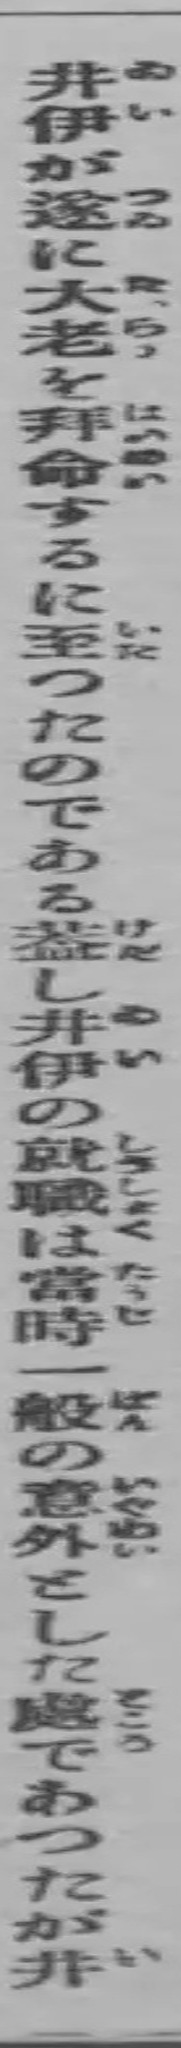井伊が遂に大老を拝命するに至つたのである蓋し井伊の就職は当時一般の意外とした処であつたが井
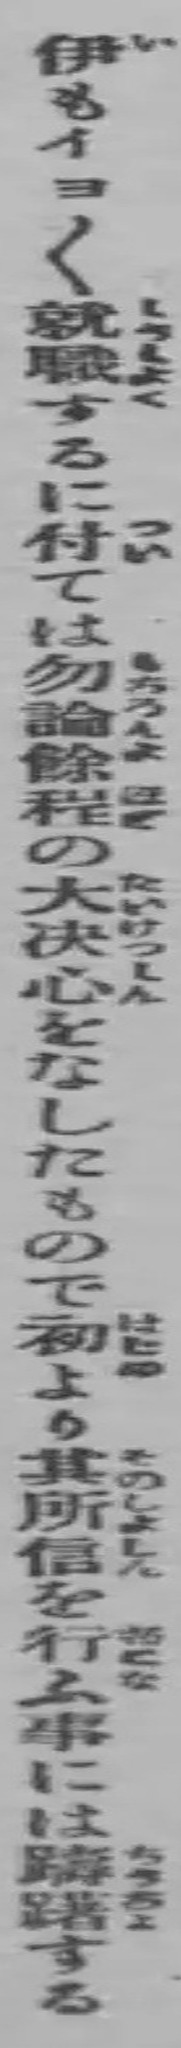伊もイヨ〳〵就職するに付ては勿論余程の大決心をなしたもので初より其所信を行ふ事には躊躇する
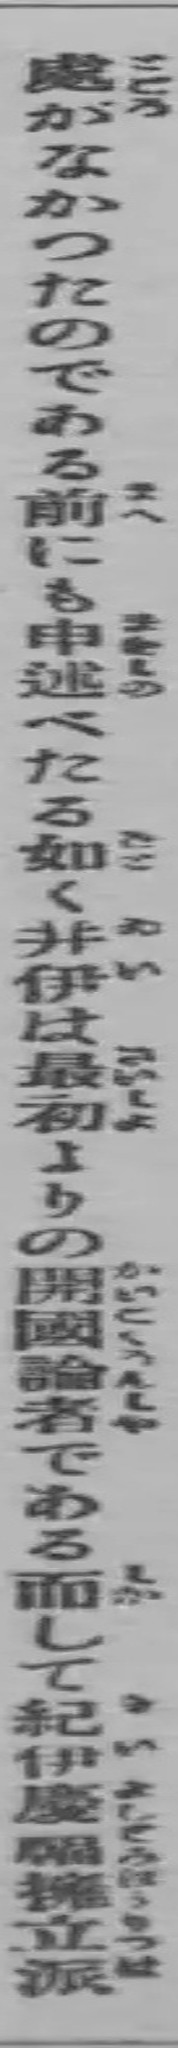処がなかつたのである前にも申述べたる如く井伊は最初よりの開国論者である而して紀伊慶福擁立派
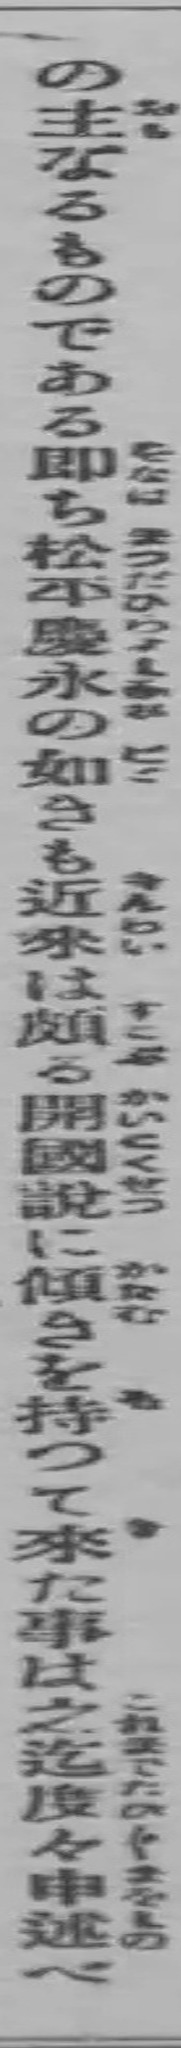の主なるものである即ち松平慶永の如きも近来は頗る開国説に傾きを持つて来た事は之迄度々申述べ
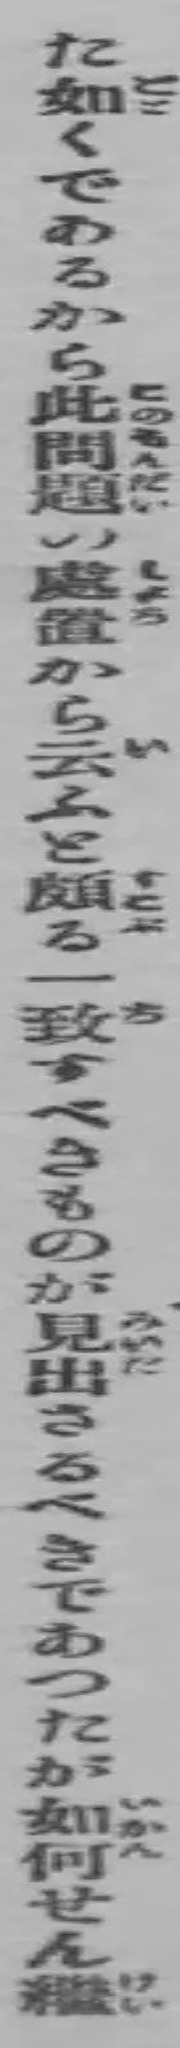た如くであるから此問題の処置から云ふと頗る一致すべきものが見出さるべきであつたが如何せん継
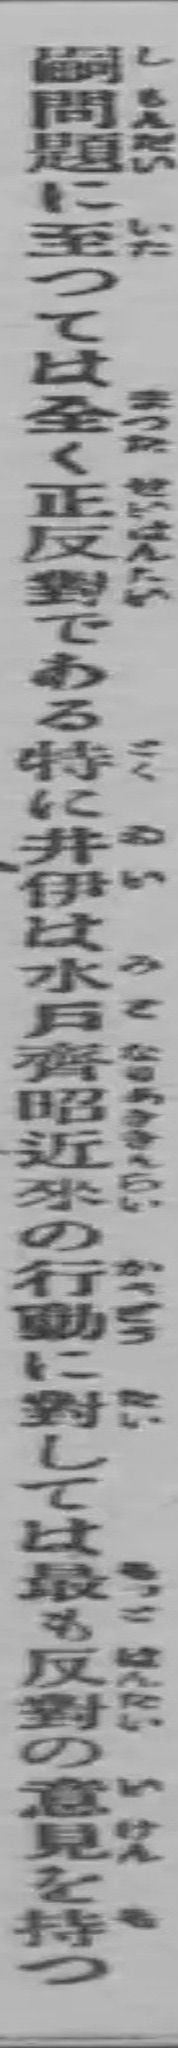嗣問題に至つては全く正反対である特に井伊は水戸斉昭近来の行動に対しては最も反対の意見を持つ
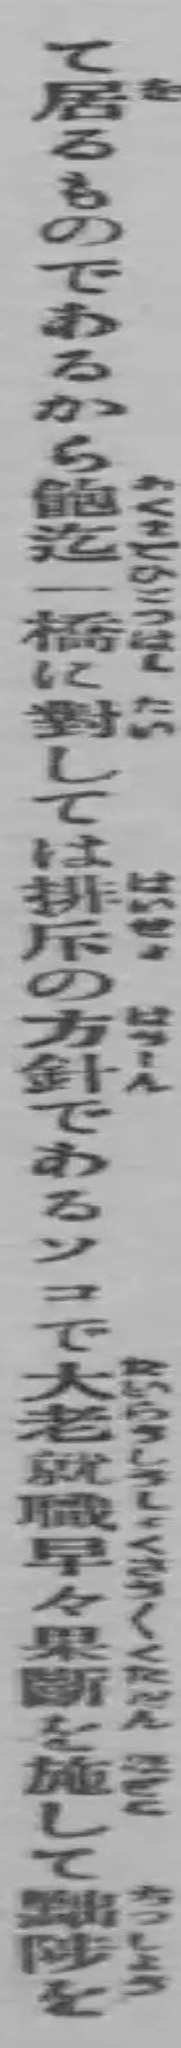て居るものであるから飽迄一橋に対しては排斥の方針であるソコで大老就職早々果断を施して蟄陟を
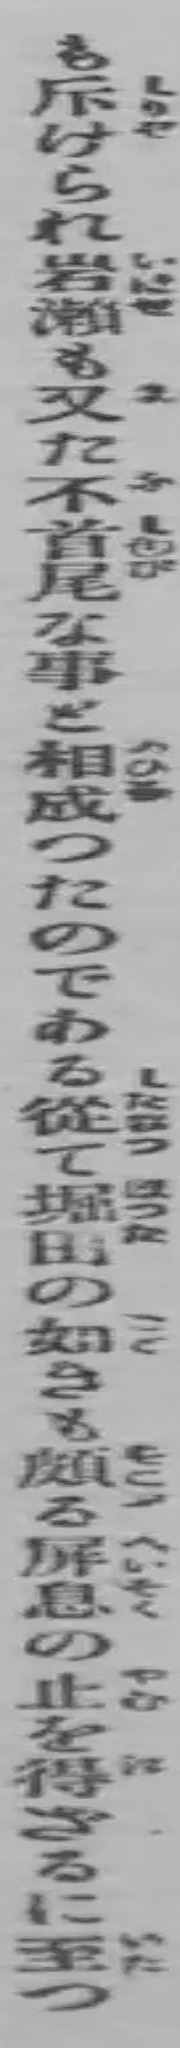も斥けられ岩瀬も又た不首尾な事と相成つたのである従て堀田の如きも頗る屏息の止を得ざるに至つ
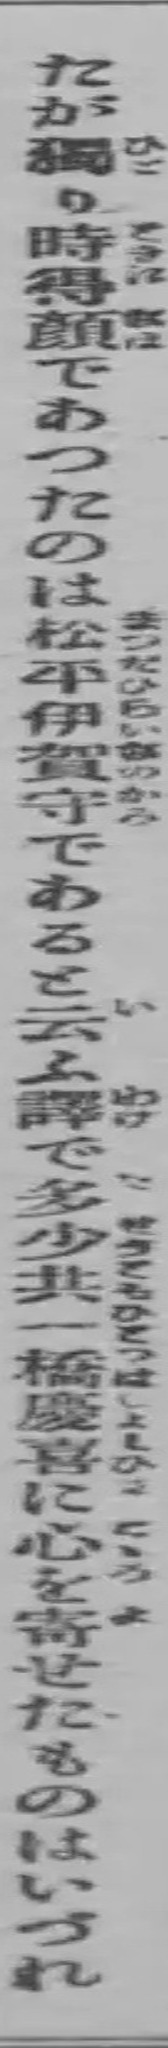たが独り時得顔であつたのは松平伊賀守であると云ふ訳で多少共一橋慶喜に心を寄せたものはいづれ
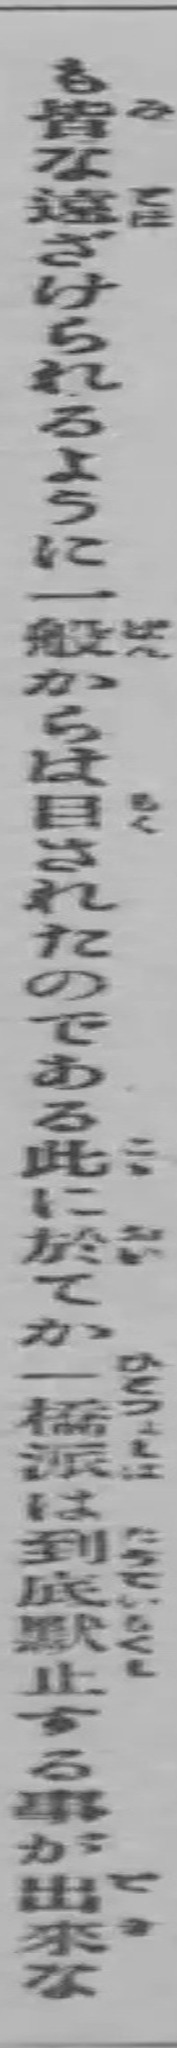も皆な遠ざけれれるように一般からは目されたのである此に於てか一橋派は到底黙止する事が出来な
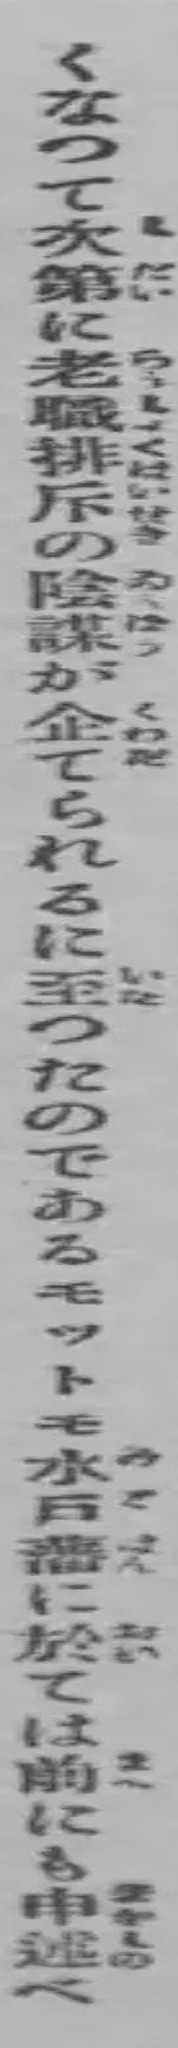くなつて次第に老職排斥の陰謀が企てられるに至つたのであるモツトモ水戸藩に於ては前にも申述べ
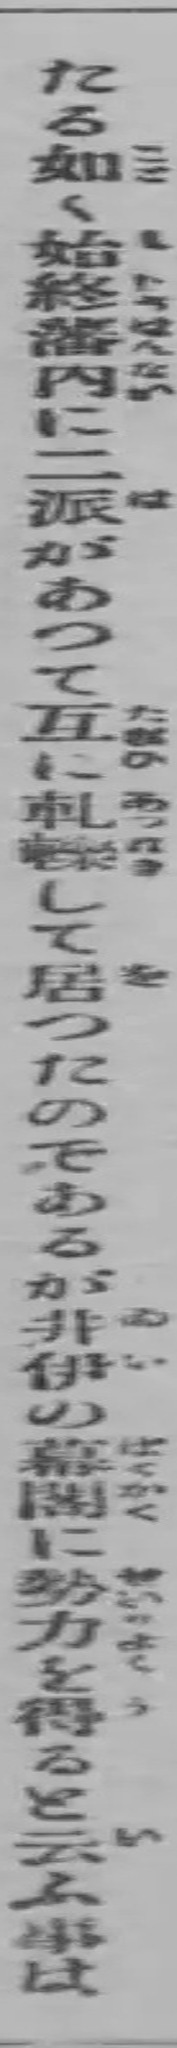たる如く始終藩内に二派があつて互に軋轢して居つたのであるが井伊の幕閣に勢力を得ると云ふ事は
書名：豊橋市史談
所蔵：国立国会図書館 National Diet Library, JAPAN
